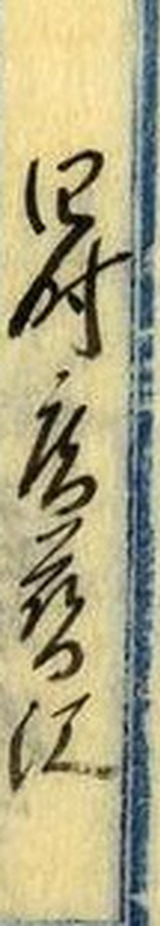四時庵暮江
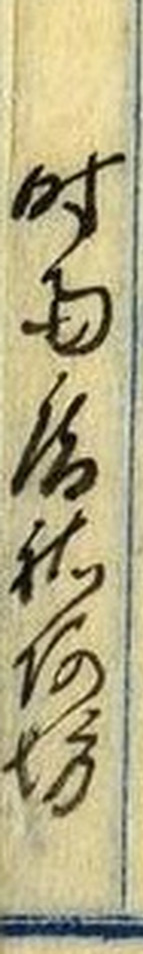時雨庵祐阿坊
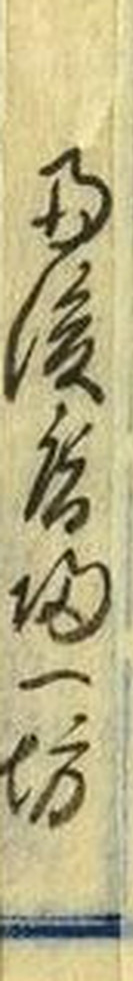雨後庵帰一坊
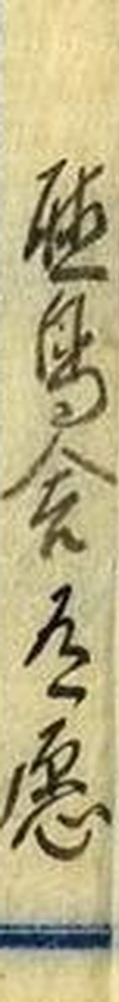聴鳥舎道愿
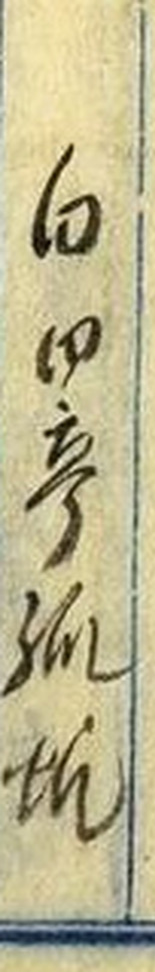白日亭孤帆

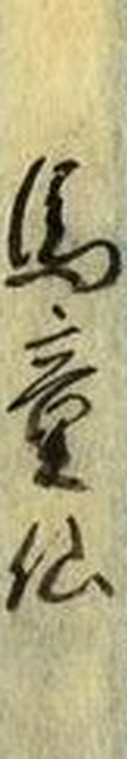馬童仙
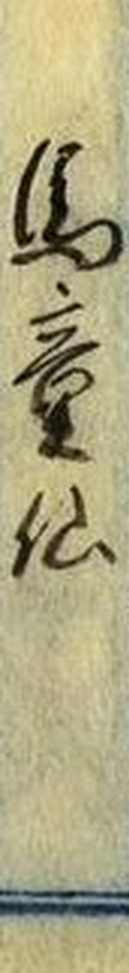馬童仙
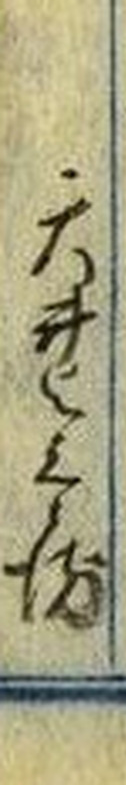天井与三兵衛
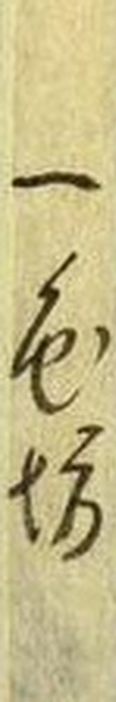一色坊
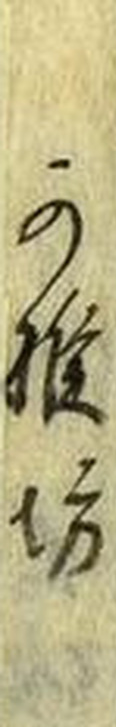可推坊
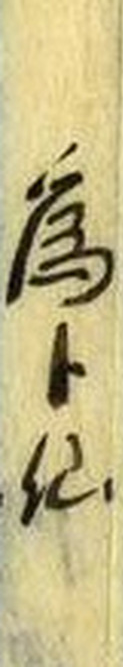為卜仙
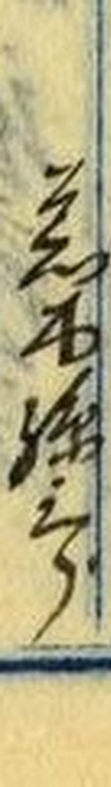荒木孫三郎
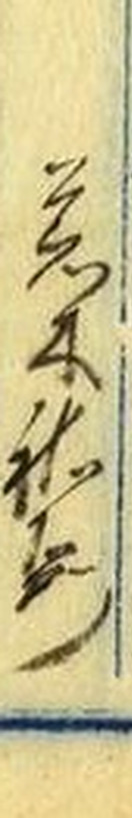荒木祐右衛門
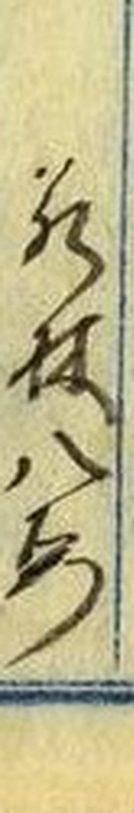若林八右衛門
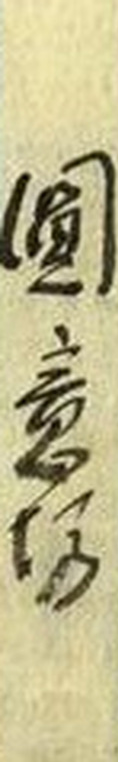円意坊
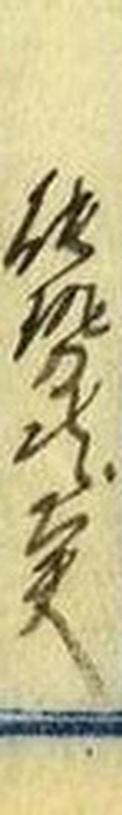能勢次郎太夫
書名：温古集 四巻
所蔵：福井県文書館 Fukui Prefectural Archives
